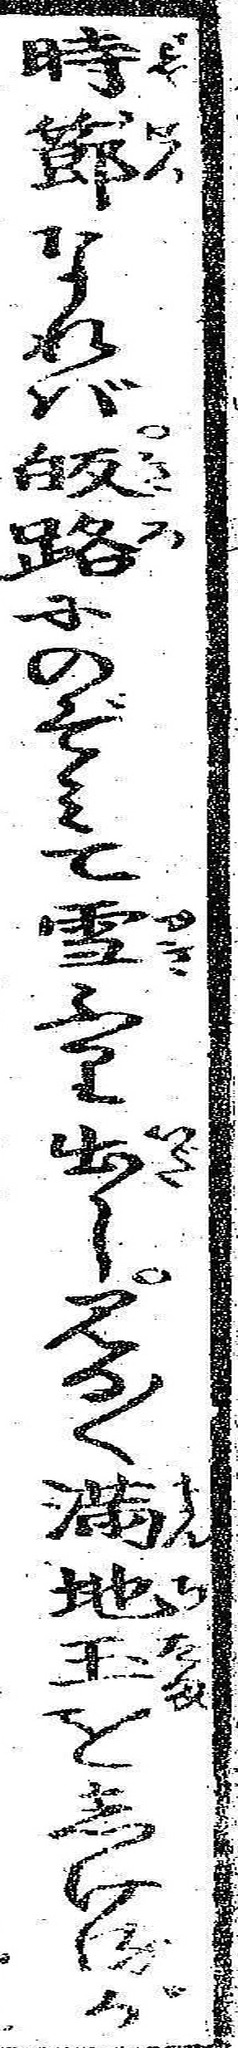時節なれば。帰路にのぞみて雪ふり出し。見る〳〵満地玉をしけるが
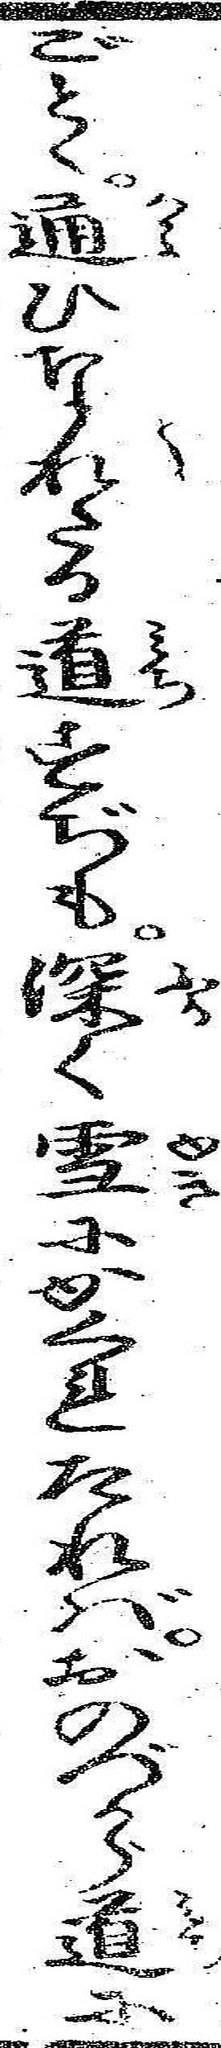ごとく。通ひなれたる道すぢも。深く雪にかくれたれば。おのづから道に
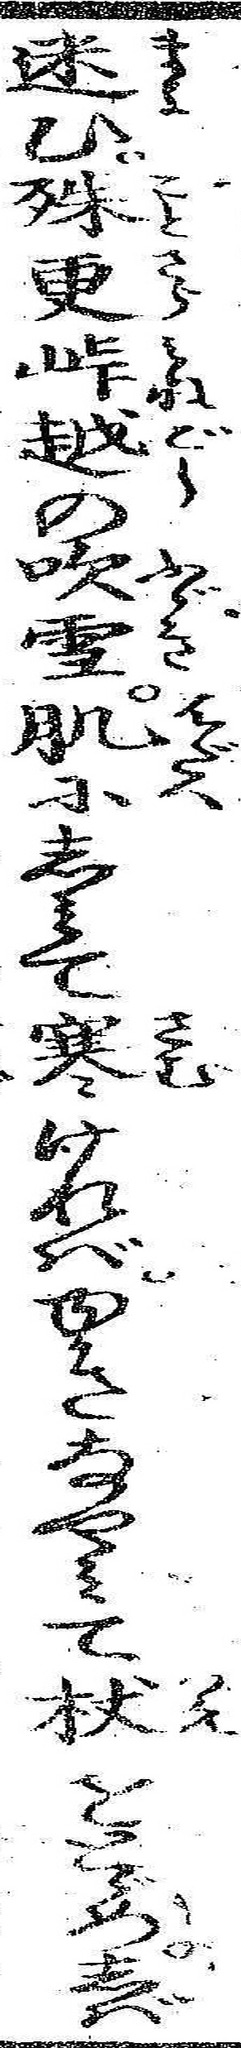迷ひ。殊更峠越の吹雪。肌にしみて寒ければ。ゆきなやみて杖をとゞめ。しば
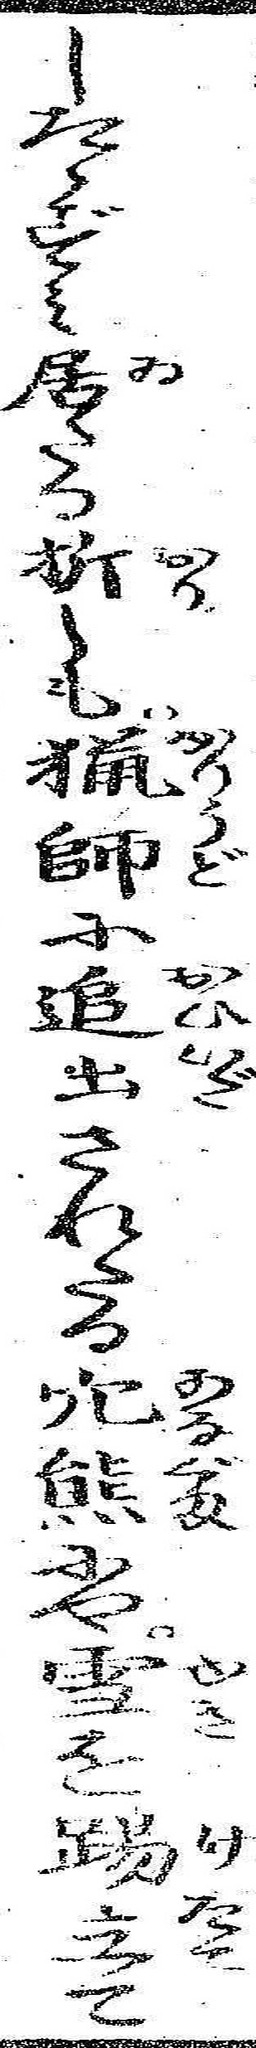したゝずみ居たる折しも。猟師に追出されたる穴熊にや。雪を踢立て
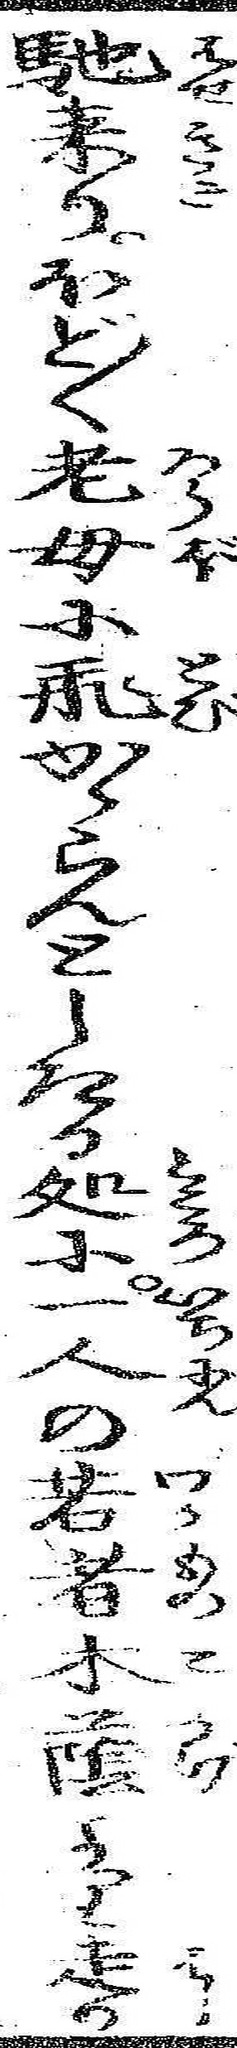馳来り。ほど〳〵老母に飛かゝらんとしたる処に。一人の若者木蔭より走り
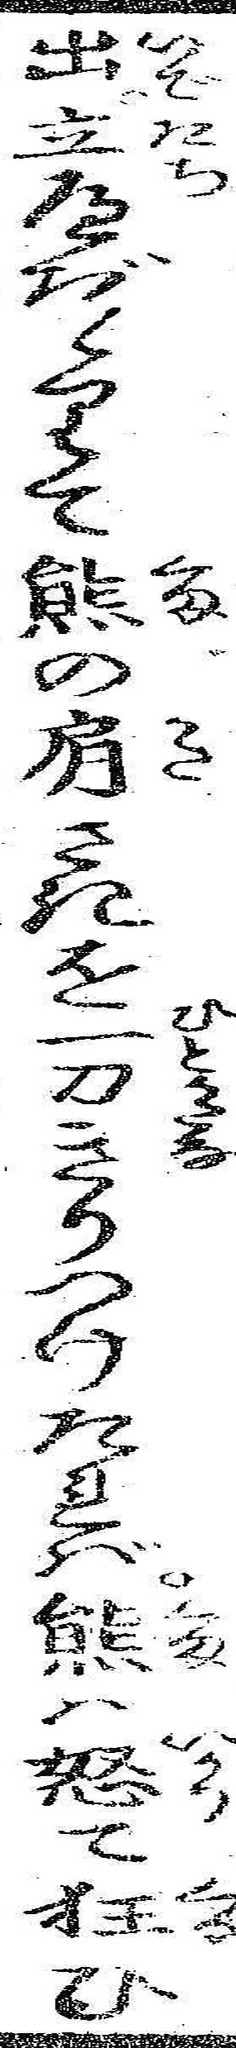出。立へだゝりて熊の肩さきを一刀きりつけたれば。熊は怒て狂ひ
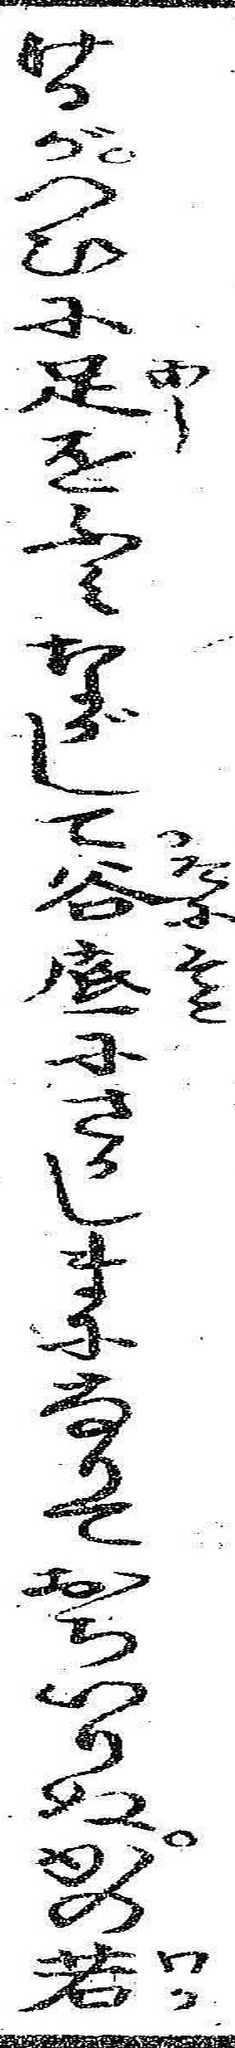けるが。つひに足をふみながして。谷底にさかしまになりておちいりぬ。かの若
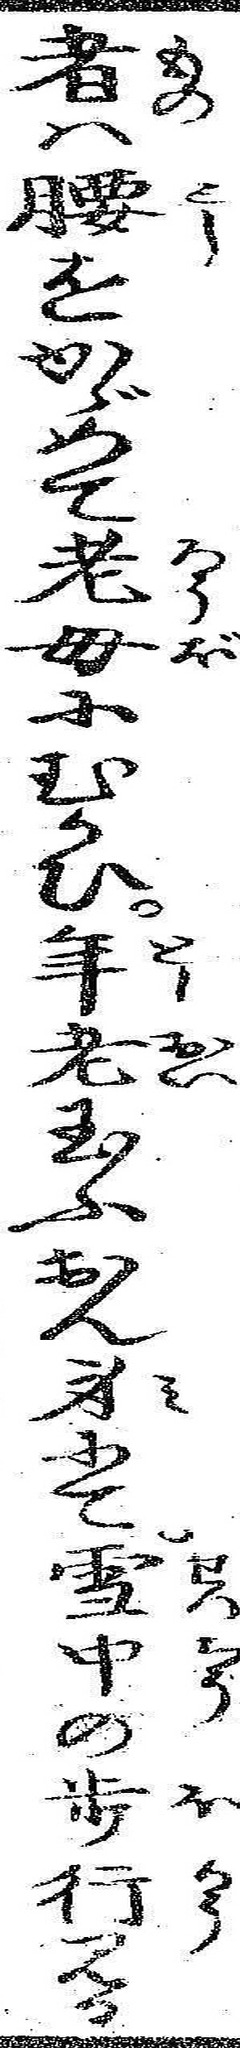者は腰をかゞめて老母にむかひ。年老玉ふおん身にて。雪中の歩行見る
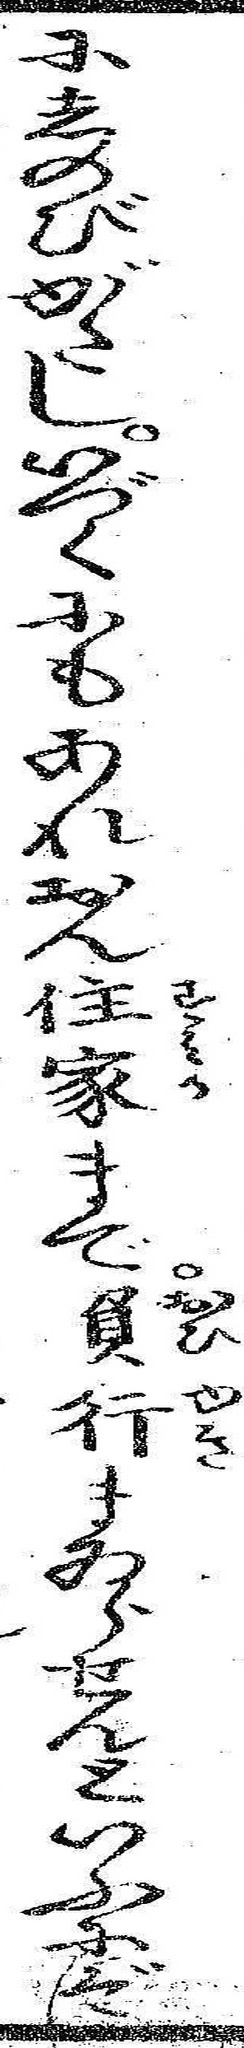にしのびがたし。いづくにもあれおん住家まで。負行まゐらせんといふにぞ
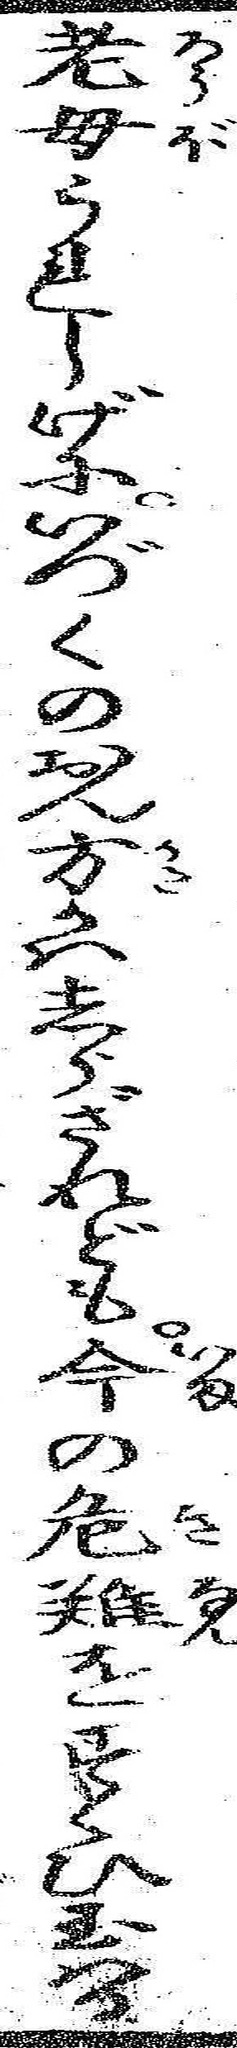老母うれしげに。いづくのおん方かはしらざれども。今の危難をすくひ玉はる
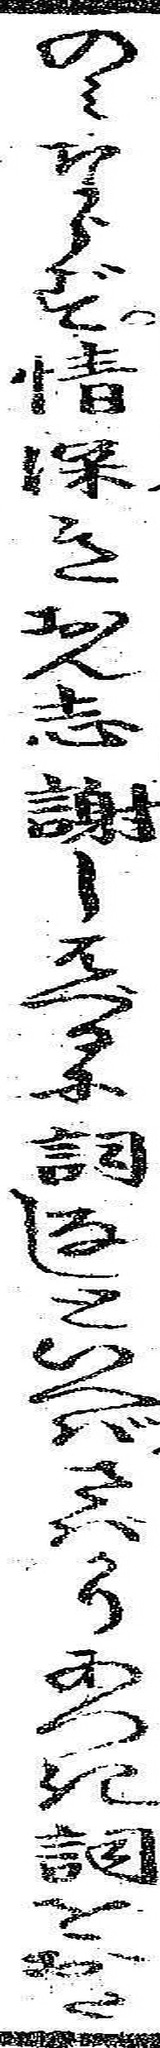のみならず。情深きおん志謝しはべるに詞なしといへば。さばかりあつき詞をおさ

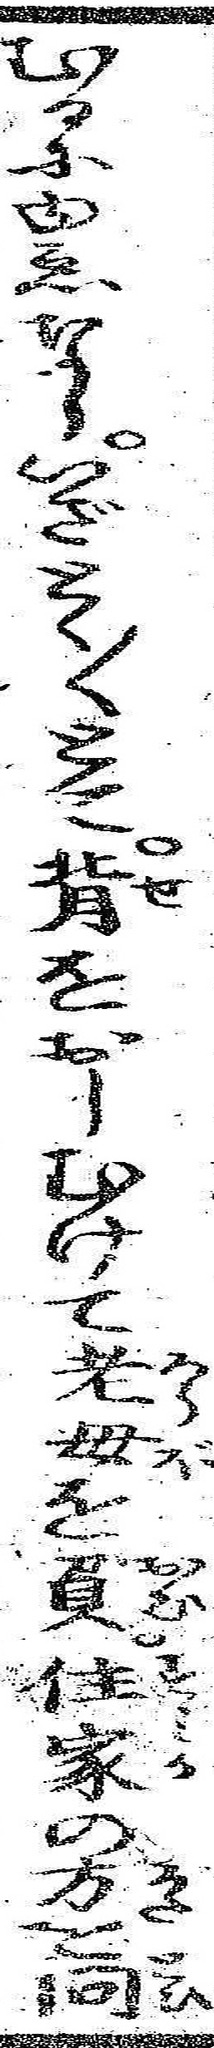むるにゆゑなし。いざとく〳〵とて。背をおしむけて老母を負。住家の方を問
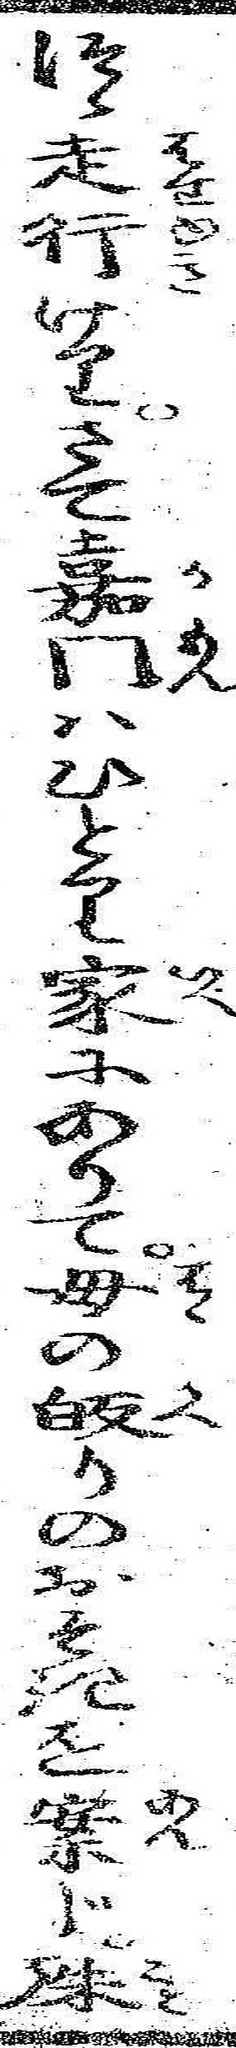つゝ走行けり。さて嘉門はひとり家にありて。母の帰りのおそきを案じ。殊
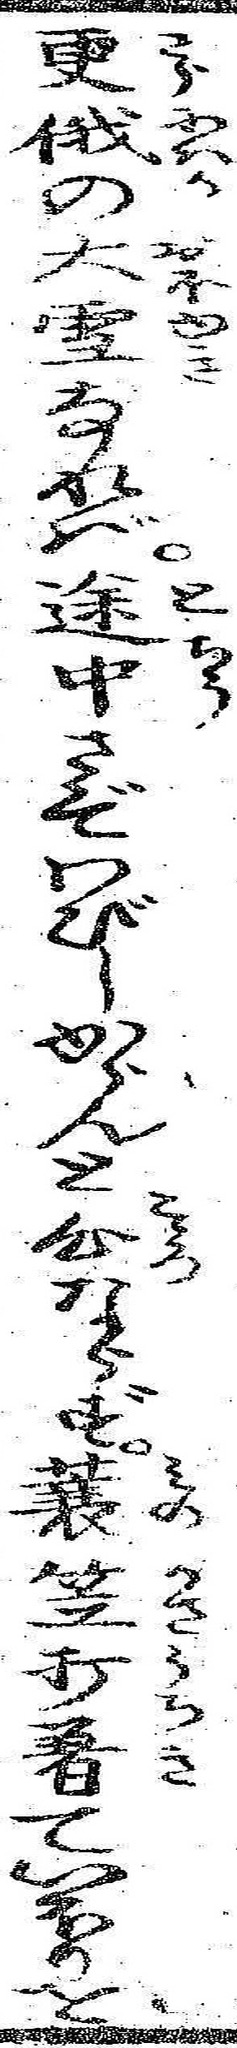更俄の大雪なれば。途中さぞわびしからんと心ならず。蓑笠打着ていほりを
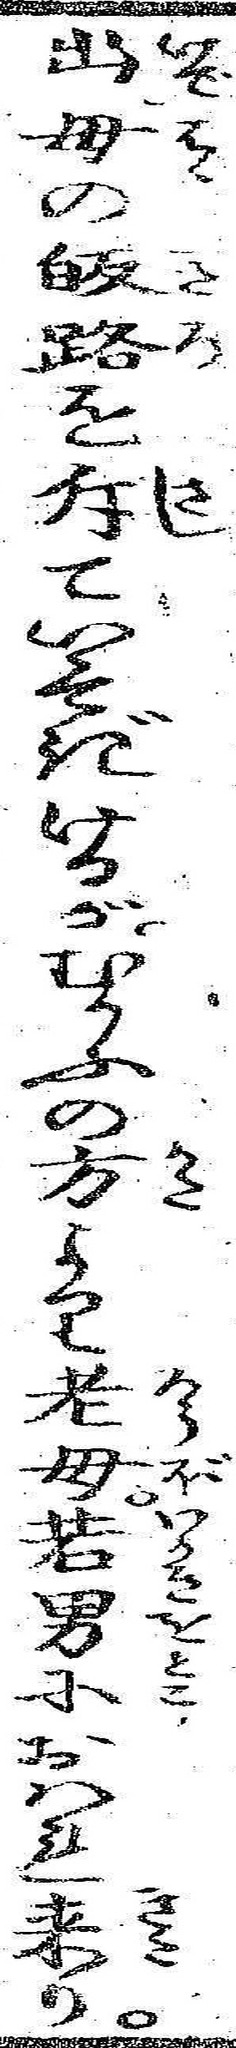出。母の帰路を斥ていそぎけるが。むかふの方より老母。若男におはれ来り。
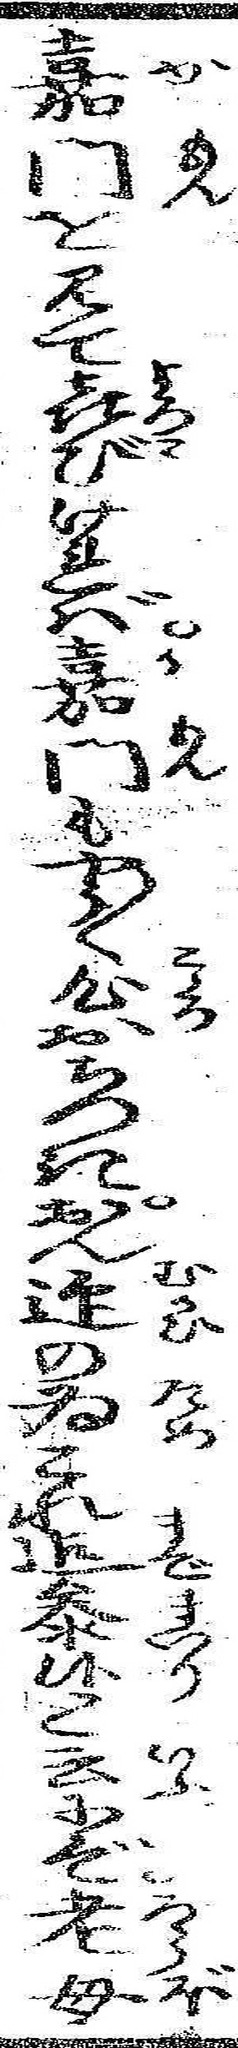嘉門を見て喜びければ。嘉門もやう〳〵心おちつき。おん迎の為これ迄参候と云にぞ。老母
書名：昔話稲妻表紙
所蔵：国文学研究資料館
